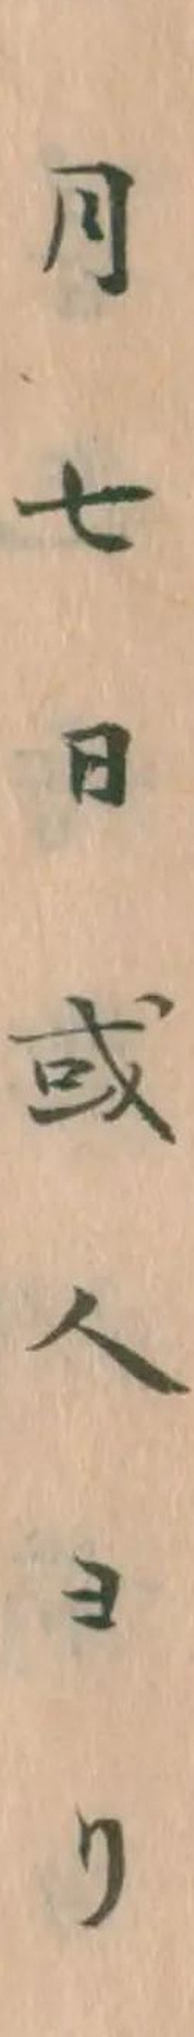四月七日或人ヨリ
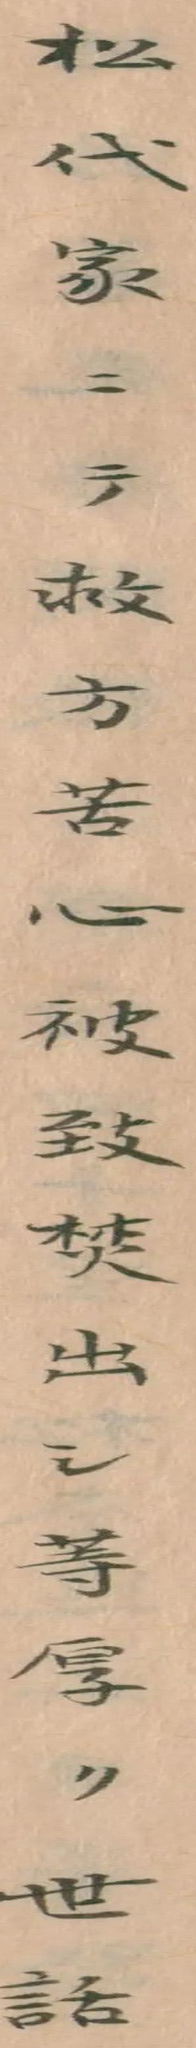松代家ニテ救方苦心被致焚出シ等厚ク世話
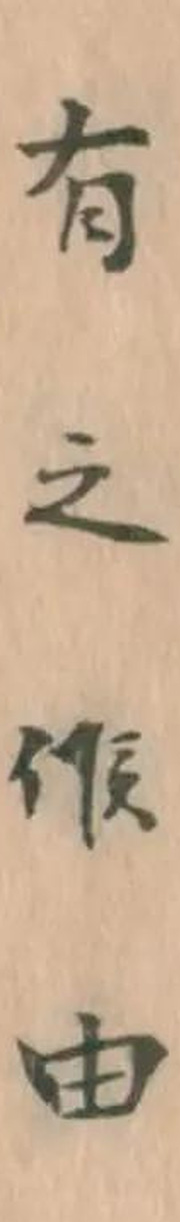有之候由

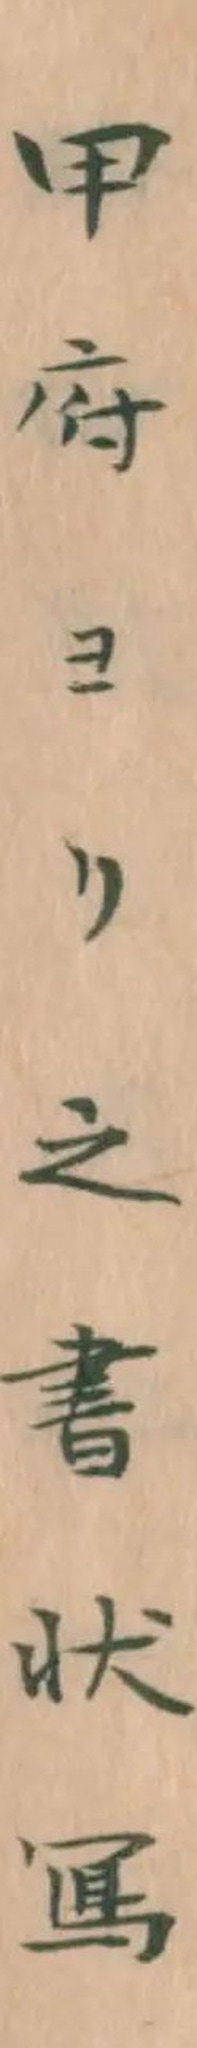甲府ヨリ之書状写
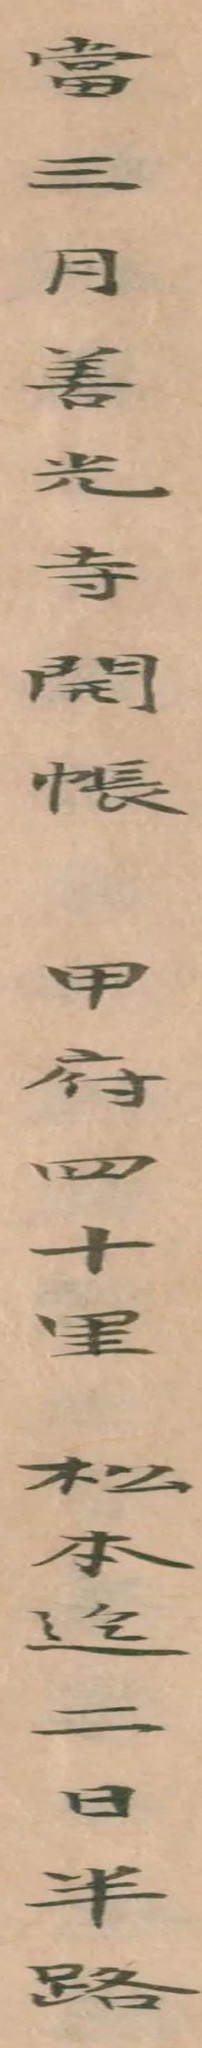当三月善光寺開帳甲府四十里松本迄二日半路
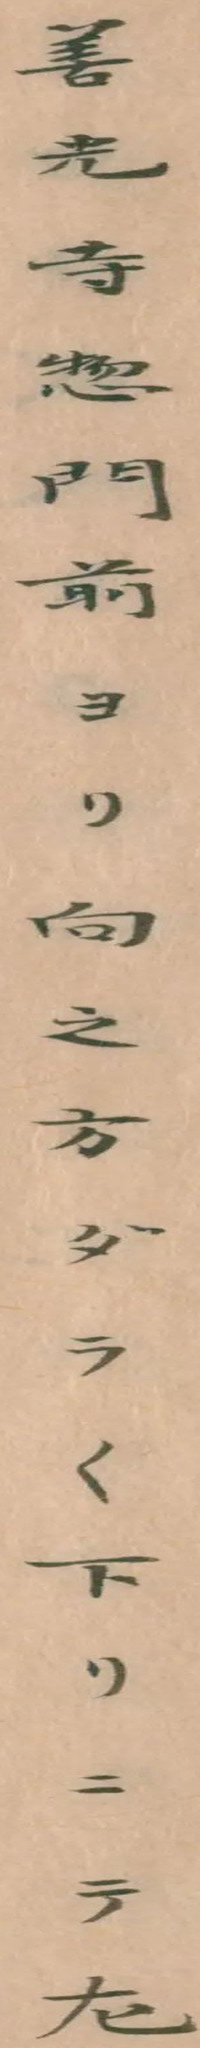善光寺惣門前ヨリ向之方ダラ〳〵下リニテ左
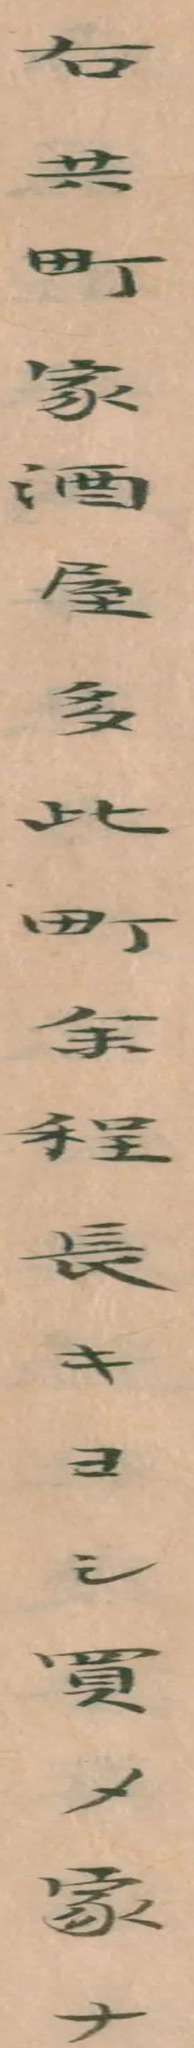右共町家酒屋多此町余程長キヨシ買〆家ナ
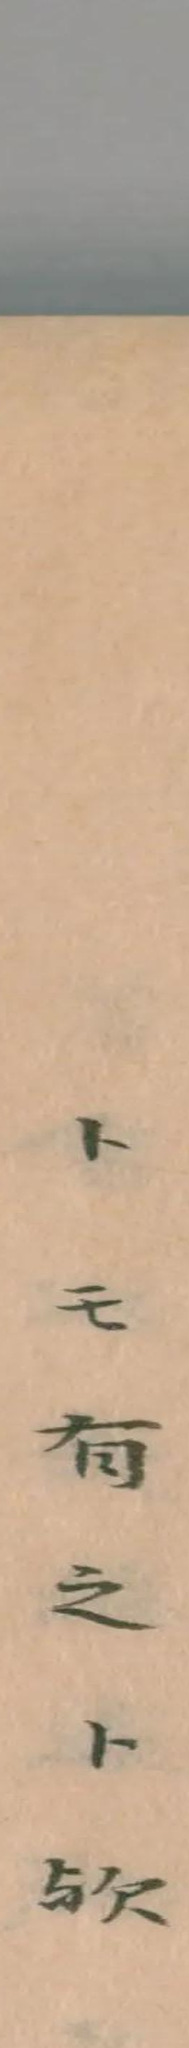トモ有之ト歟
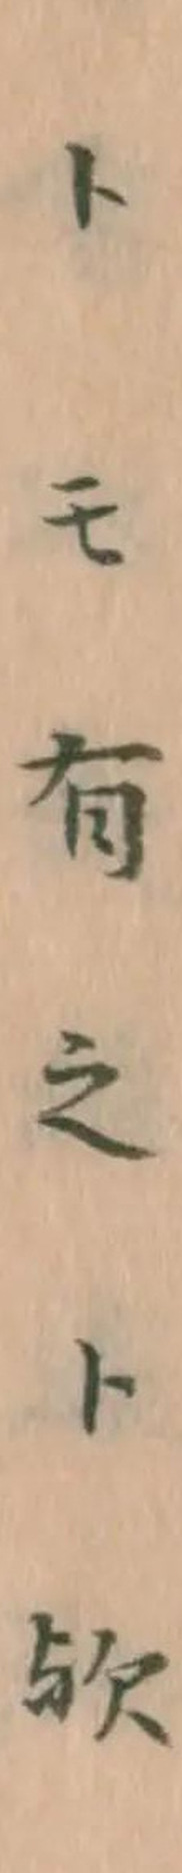トモ有之ト歟
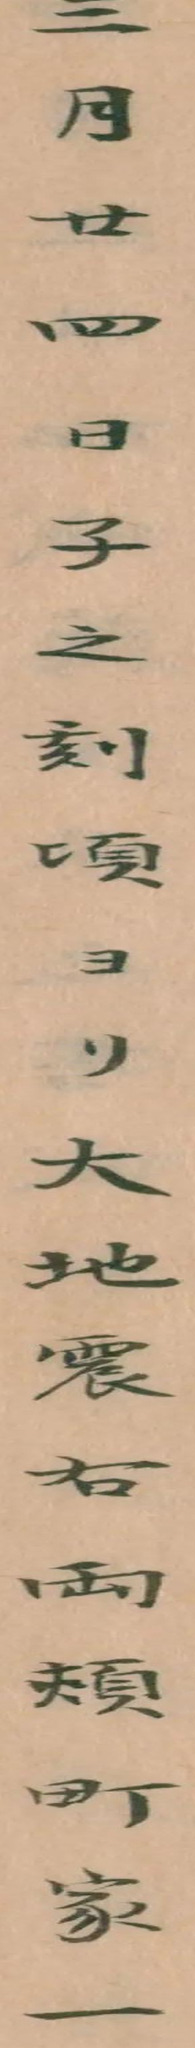三月廿四日子之刻頃ヨリ大地震右両頬町家一
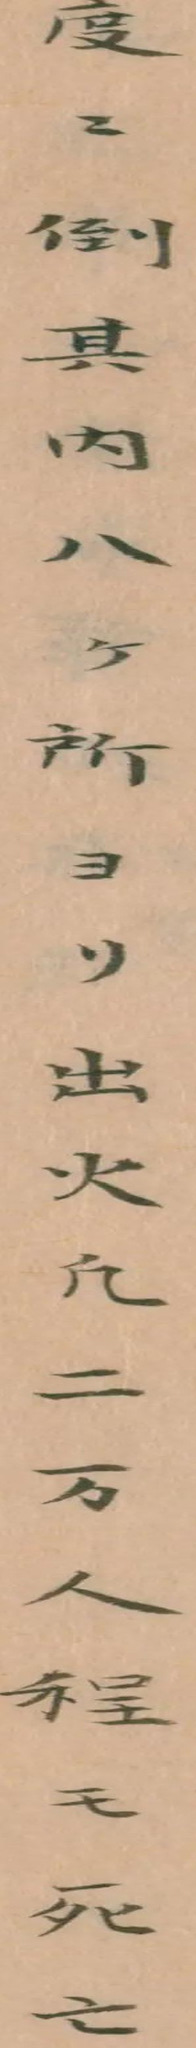度二倒其内八ヶ所ヨリ出火凡二万人程モ死亡
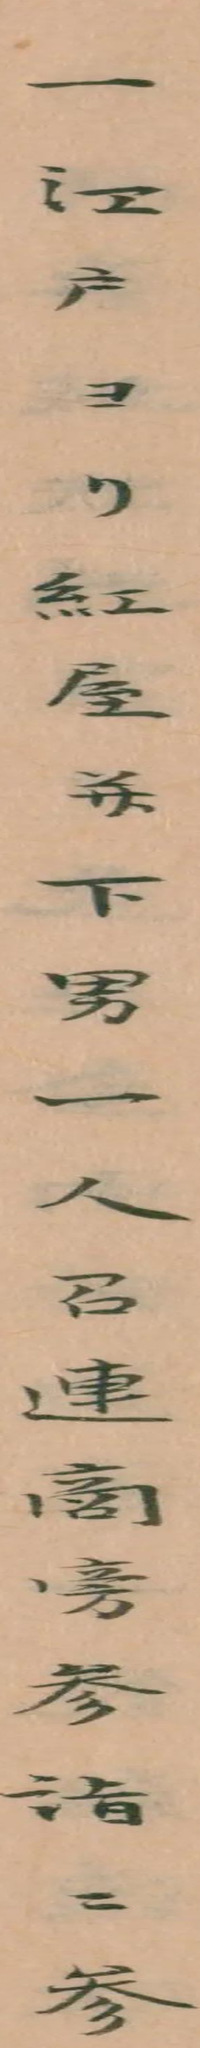一江戸ヨリ紅屋并下男一人召連商旁参詣二参
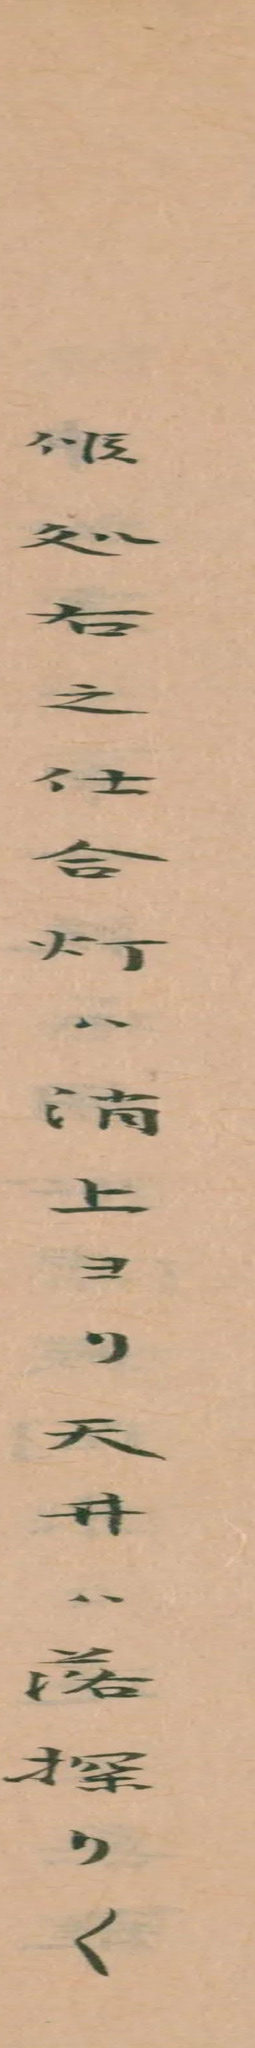候処右之仕合灯ハ消上ヨリ天井ハ落探り〳〵
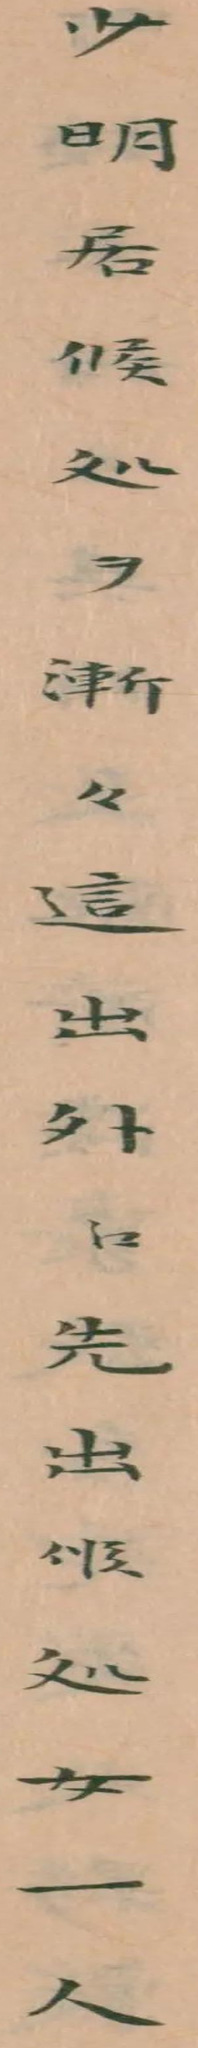少明居候処ヲ漸々這出外江先出候処女一人
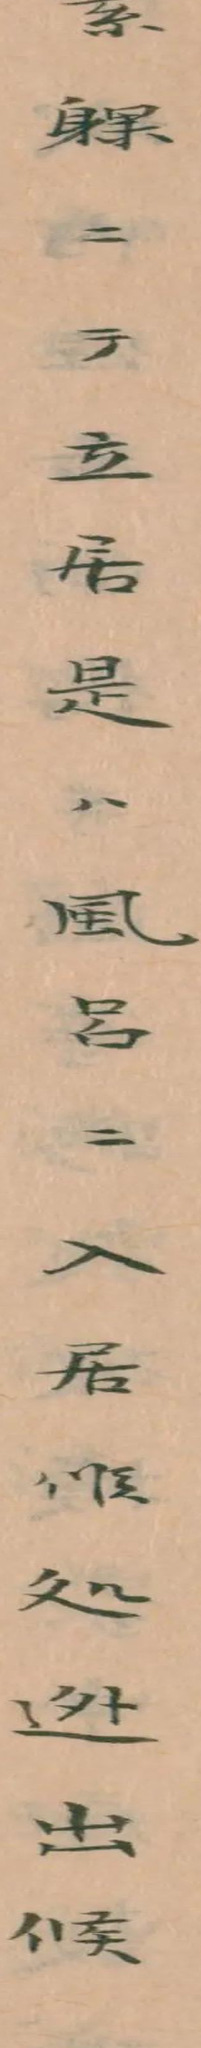素裸ニテ立居是ハ風呂二入居候処逃出候
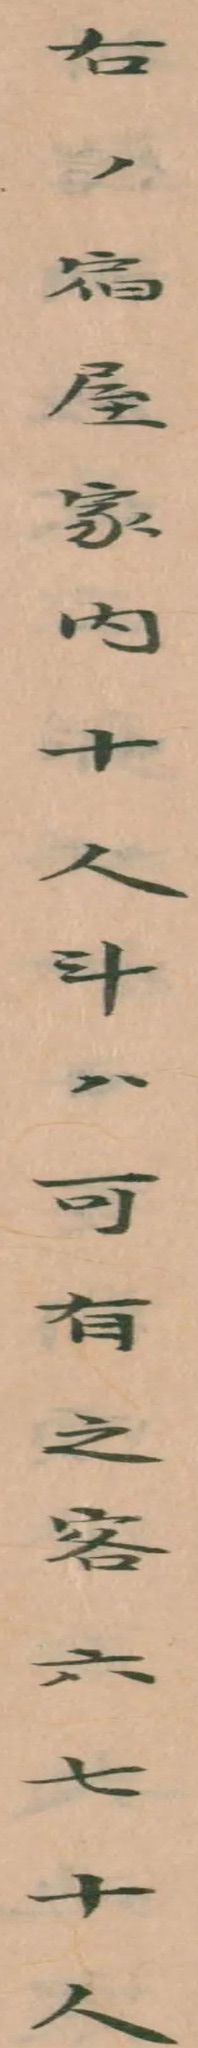右ノ宿屋家内十人斗ハ可有之客六七十人
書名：地災撮要. 巻1(噴火山・地震ノ部)
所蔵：国立国会図書館 National Diet Library, JAPAN
